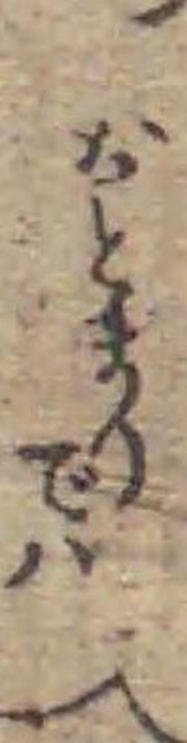おとまりでは
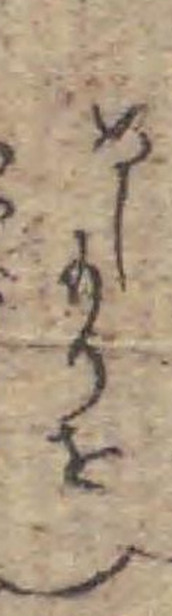めしもりを
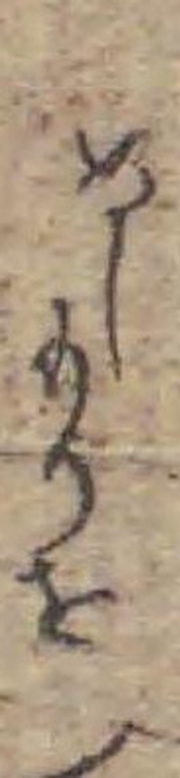めしもりを
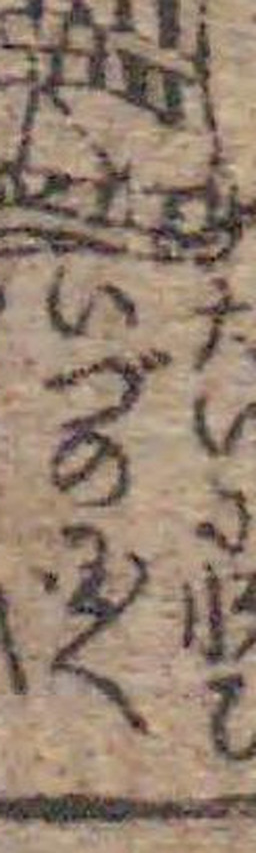いづの国へ
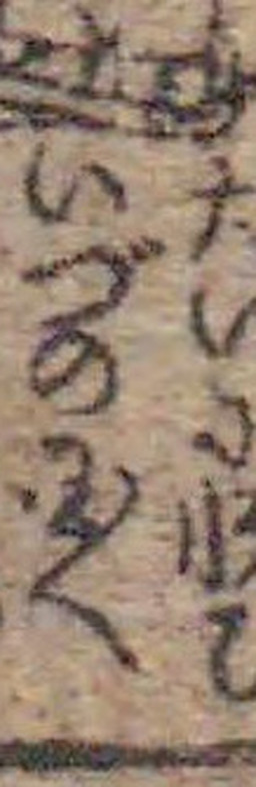いづの国へ
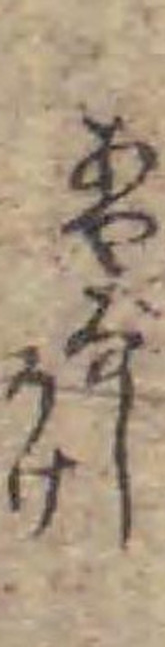あやなし
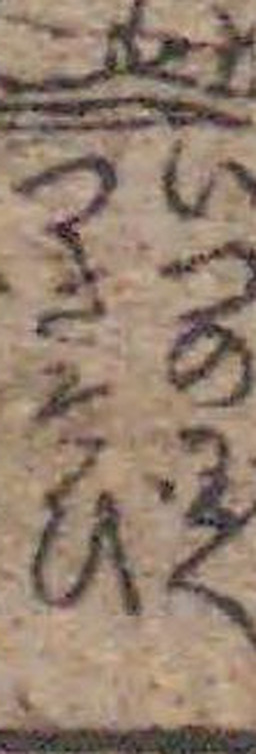つきそひ
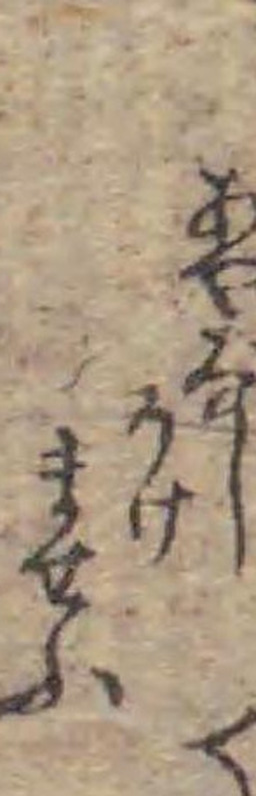ませふ
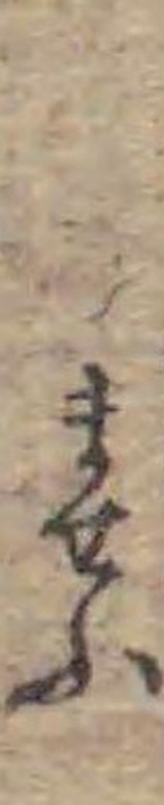ませふ
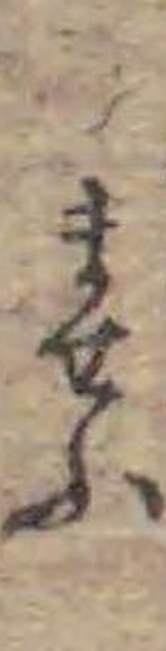ませふ
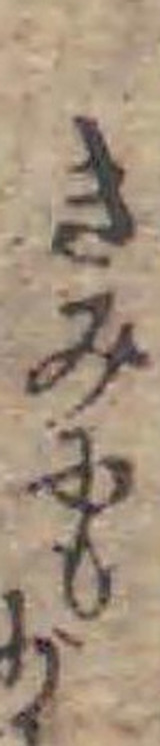きみにも
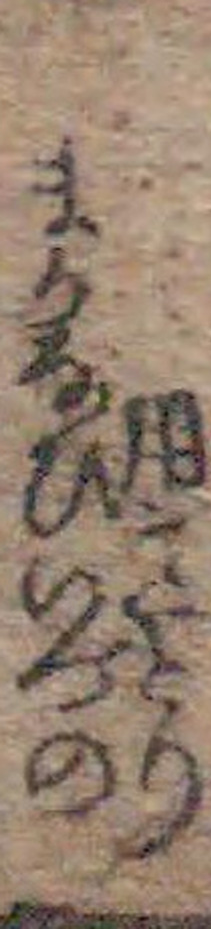まかなひいづの
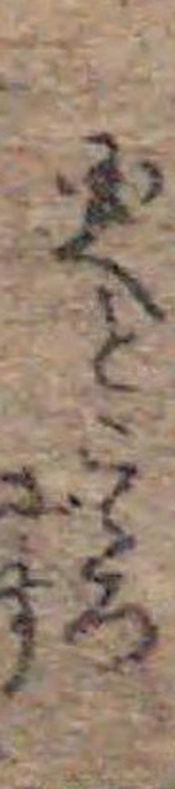国へとこゝろ
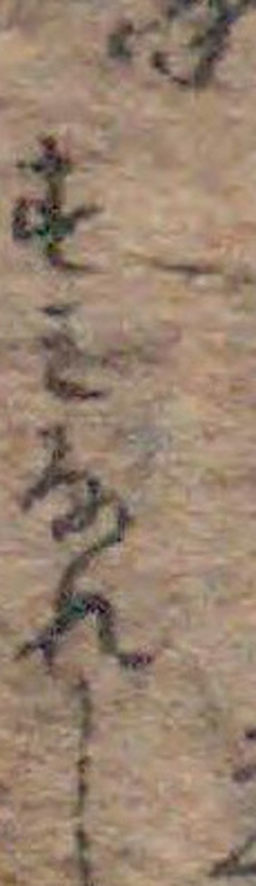すみなれし
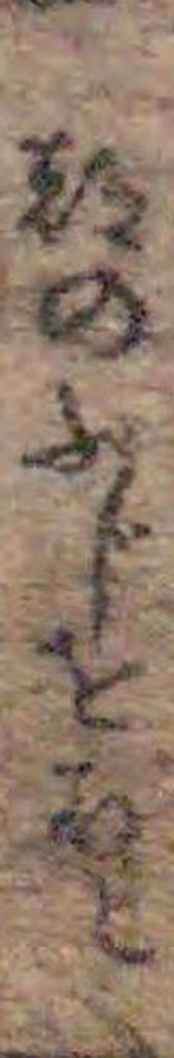都のふじをあと
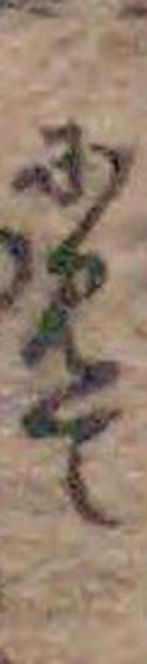に見て
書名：三舛増鱗組 : 3巻
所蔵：国立国会図書館 National Diet Library, JAPAN
